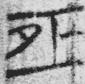亙
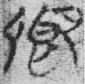卿（亨）
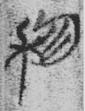利
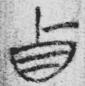貞
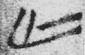亡
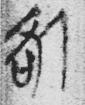咎
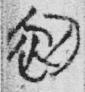初
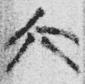六
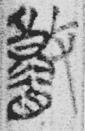○（浚）
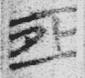○（恆）
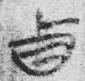貞
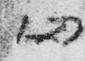凶
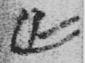亡（无）
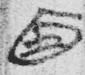○（攸）
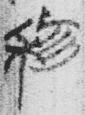利
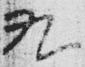九
